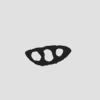四
